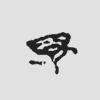𠭁
